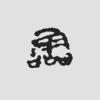霝
